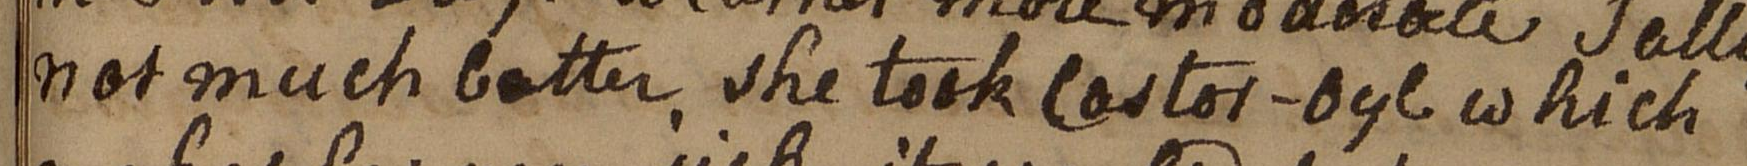not much batter, she took Castor-oyl which
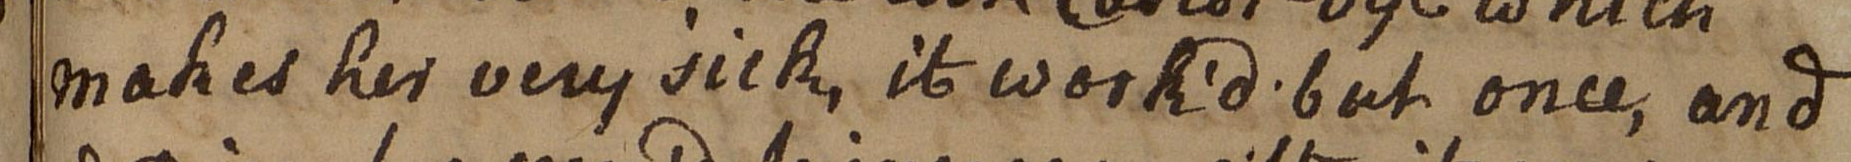makes her very sick, it work'd but once, and
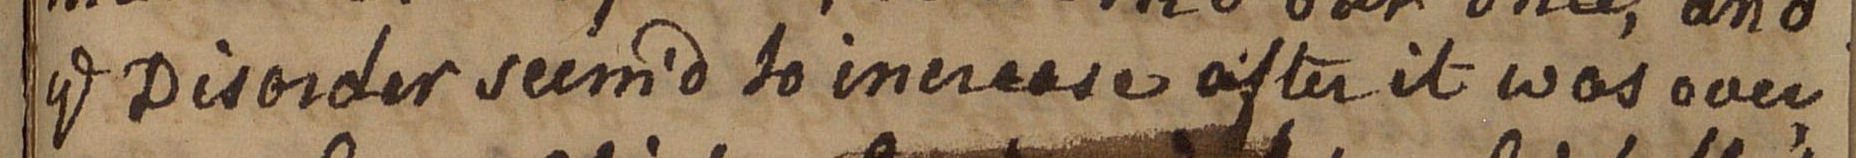y^e disorder seem'd to increase after it was over,
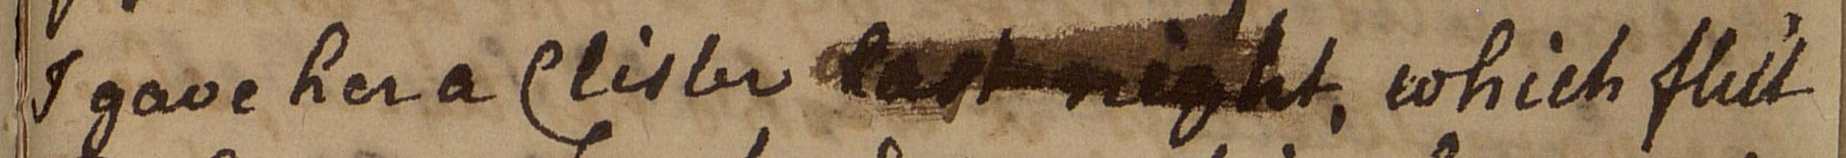I gave her a Clister last night, which flus-
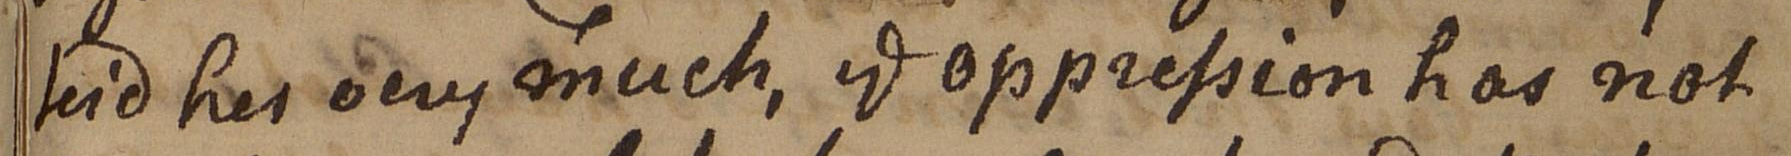ter'd her very much, y^e oppression has not
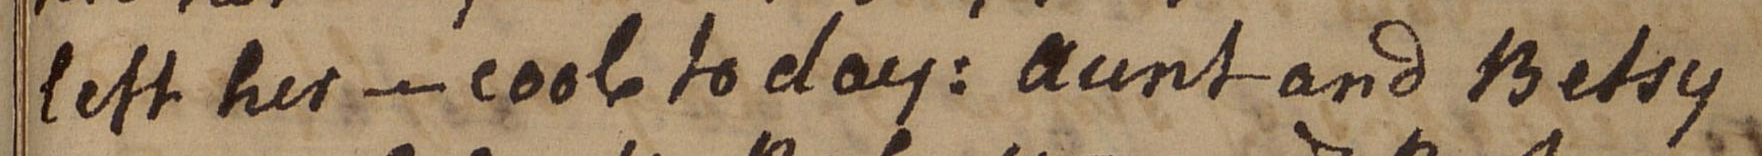left her- cool to day: Aunt and Betsy
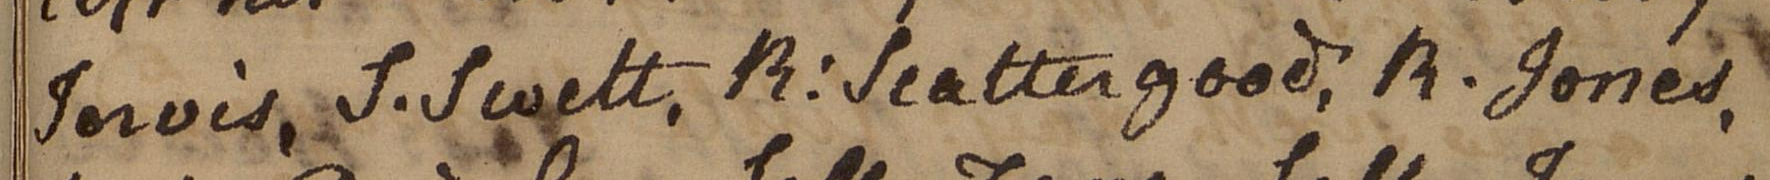Jervis, S. Swett, R: Scattergood, R. Jones
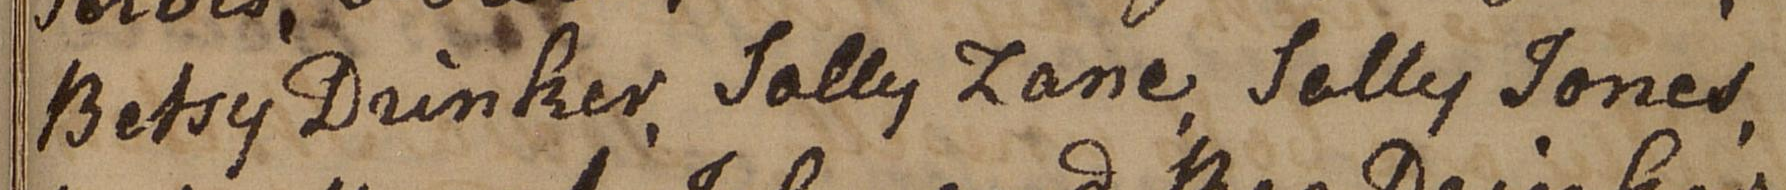Betsy Drinker, Sally Zane, Sally Jones,
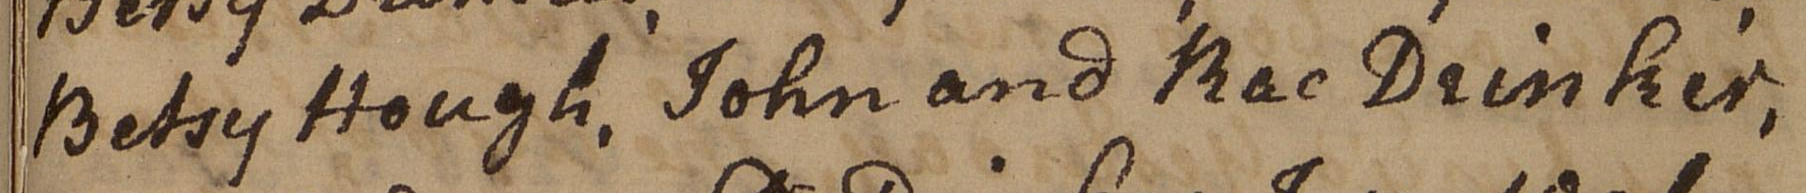Betsy Hough, John and Rac Drinker,
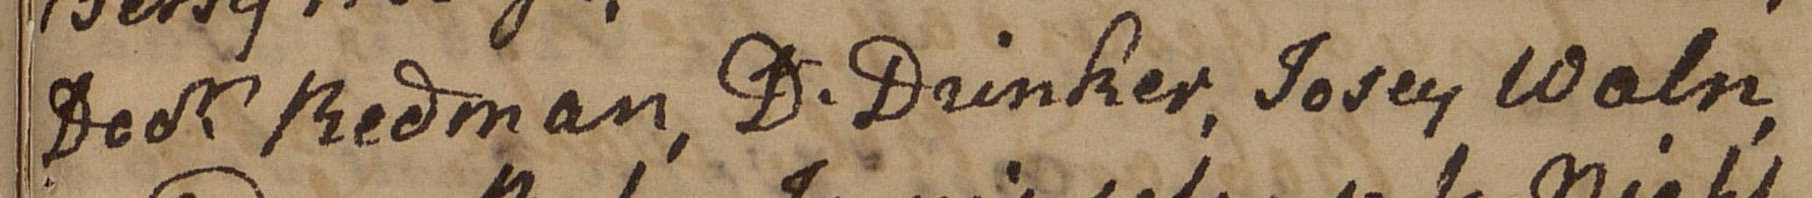Doc^r. Redman, D. Drinker, Josey Waln,
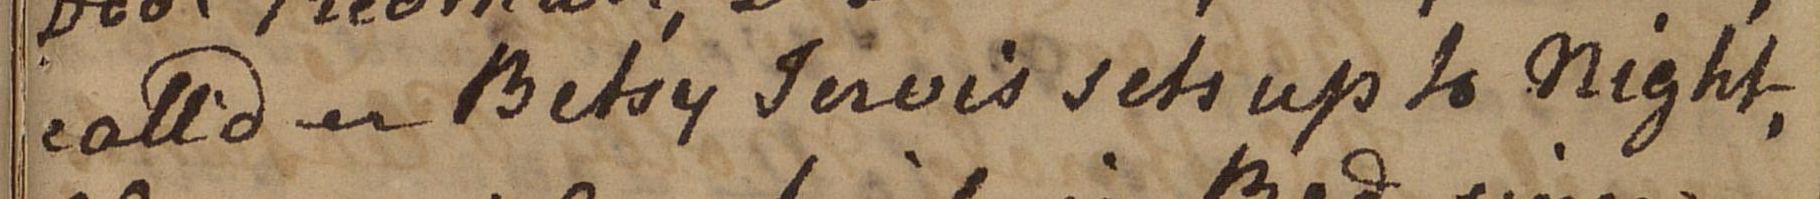call'd- Betsy Jervis sets up to night,
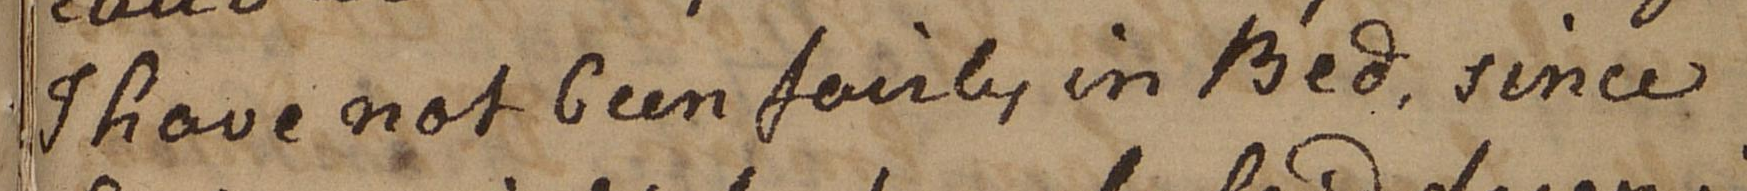I have not been fairly in Bed, since
